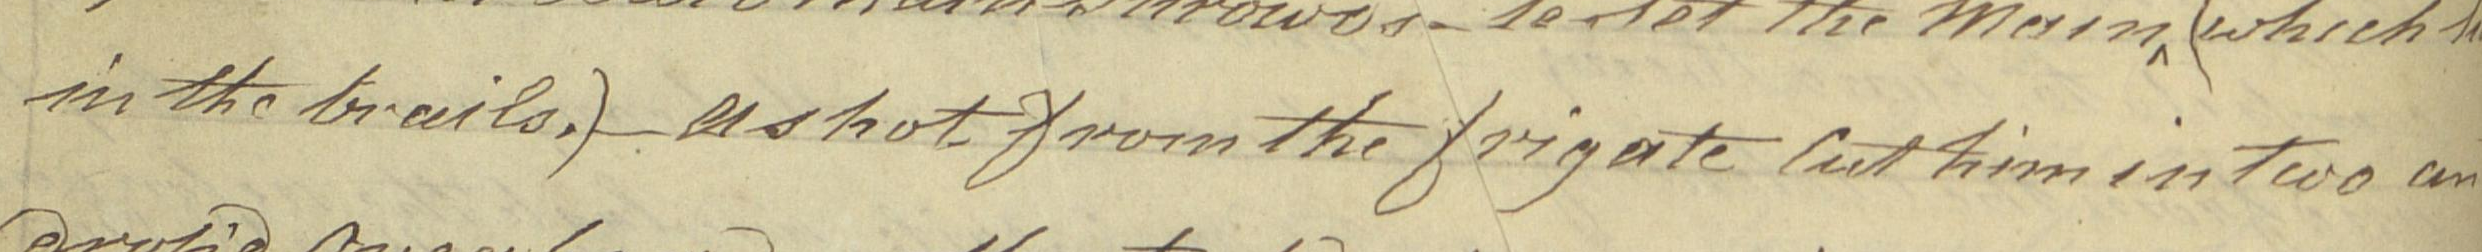in the trails.) A shot from the frigate cut him in two and
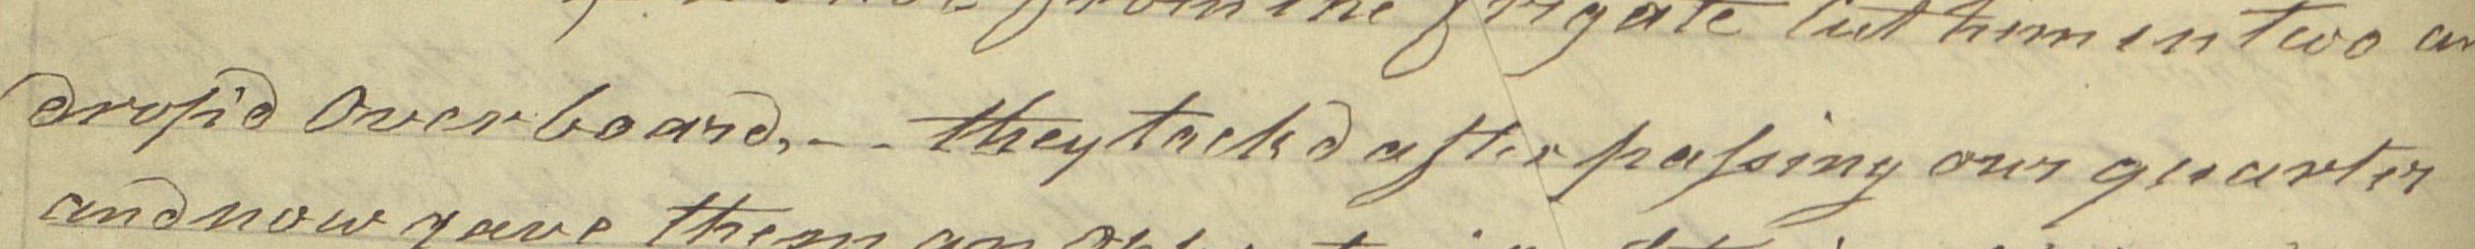drop'd over board, they tackd after passing our quarter
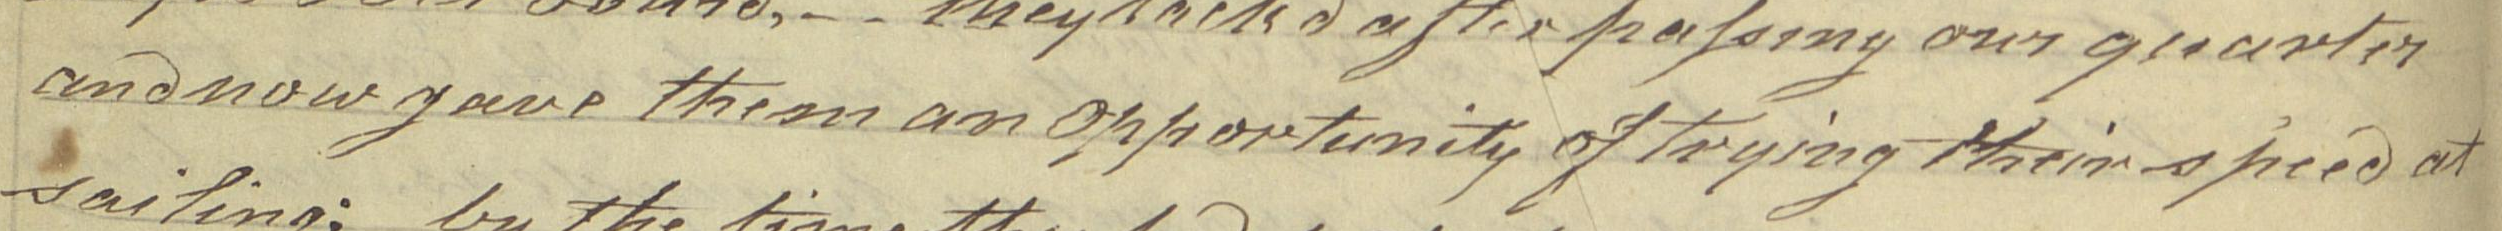and now gave them an opportunity of trying their speed at
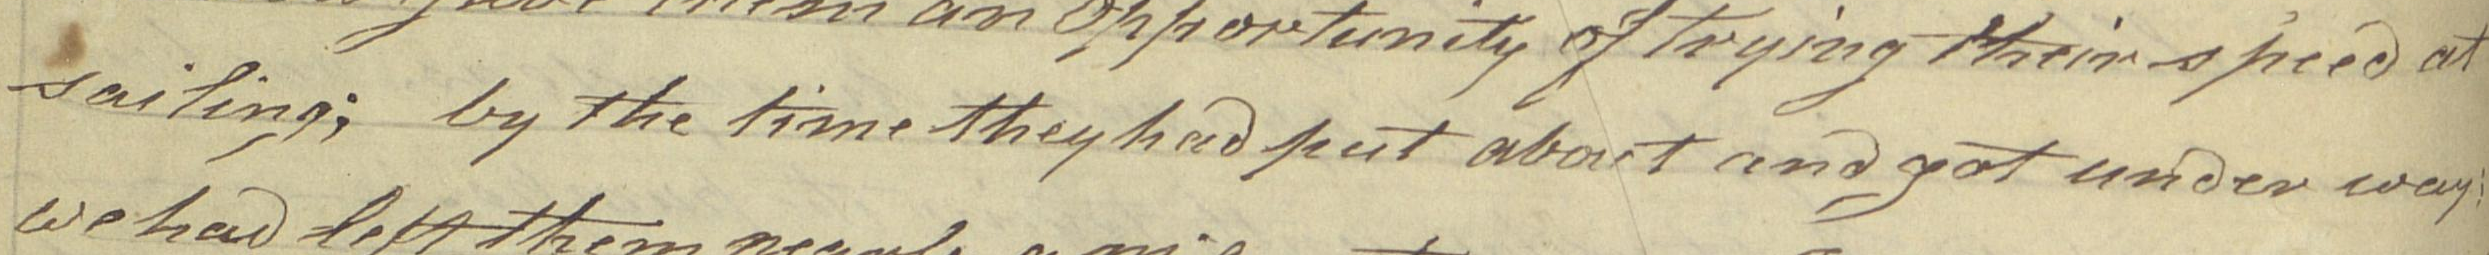sailing; by the time they had put about and got under way
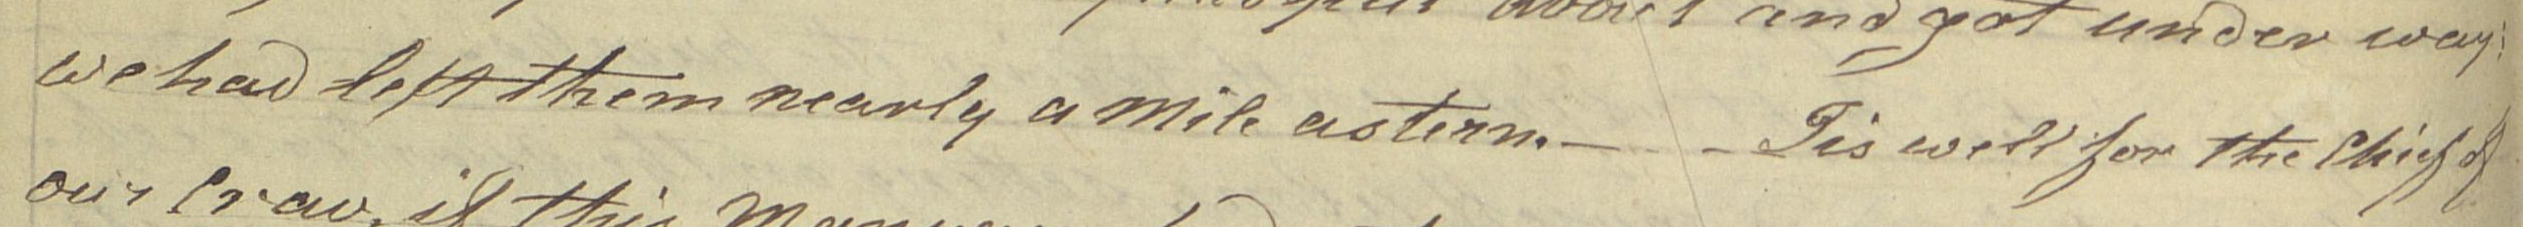we had left them nearly a Mile astern. Tis well for the Chief of
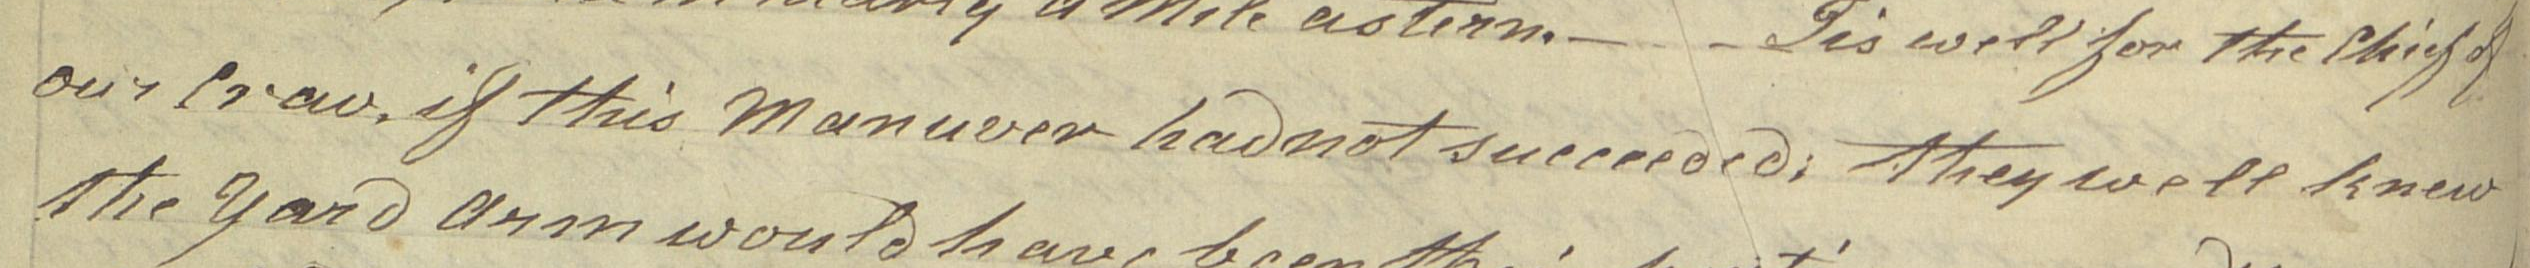our Crow, if this Manuver had not succeeded they well knew
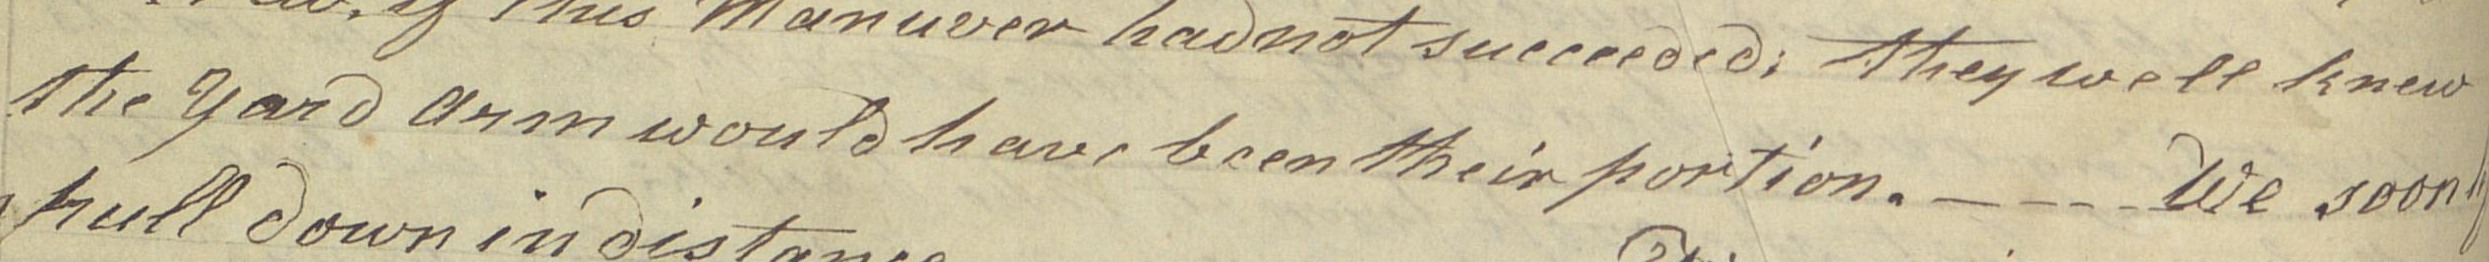the Yard Arm would have been their portion. We soon
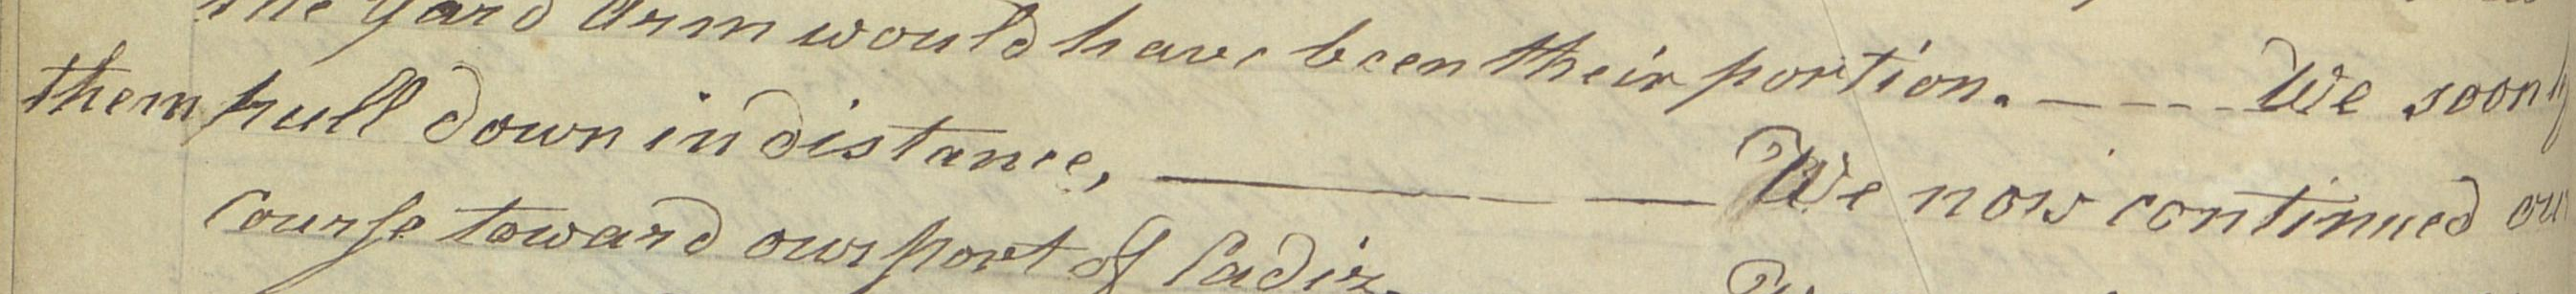them pull down in distance, We now continued ou-
